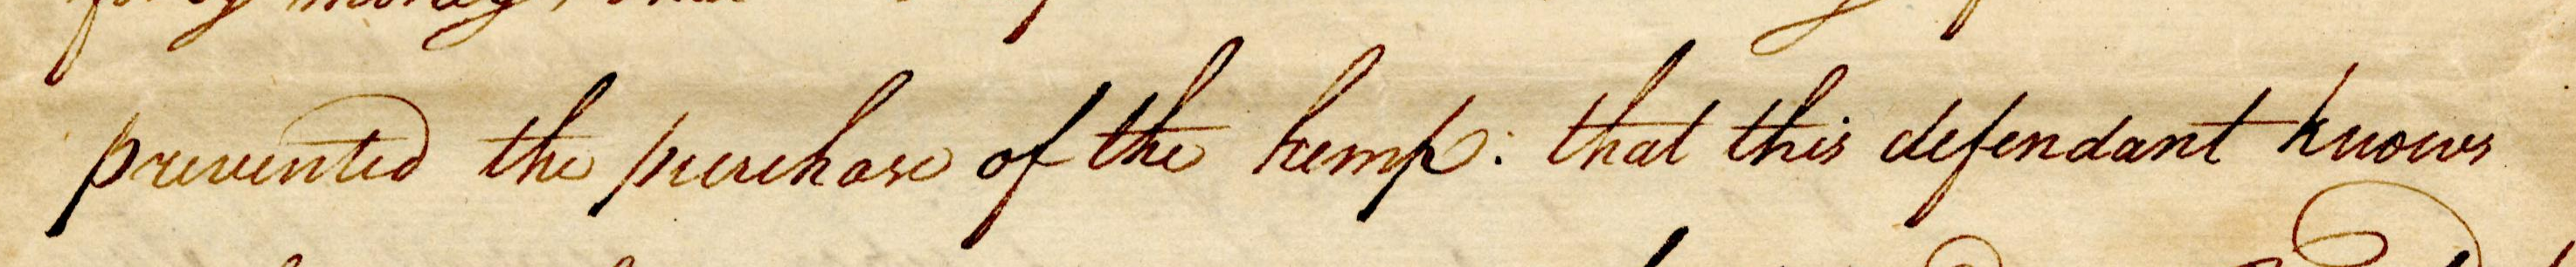prevented the purchase of the hemp. that this defendant knows
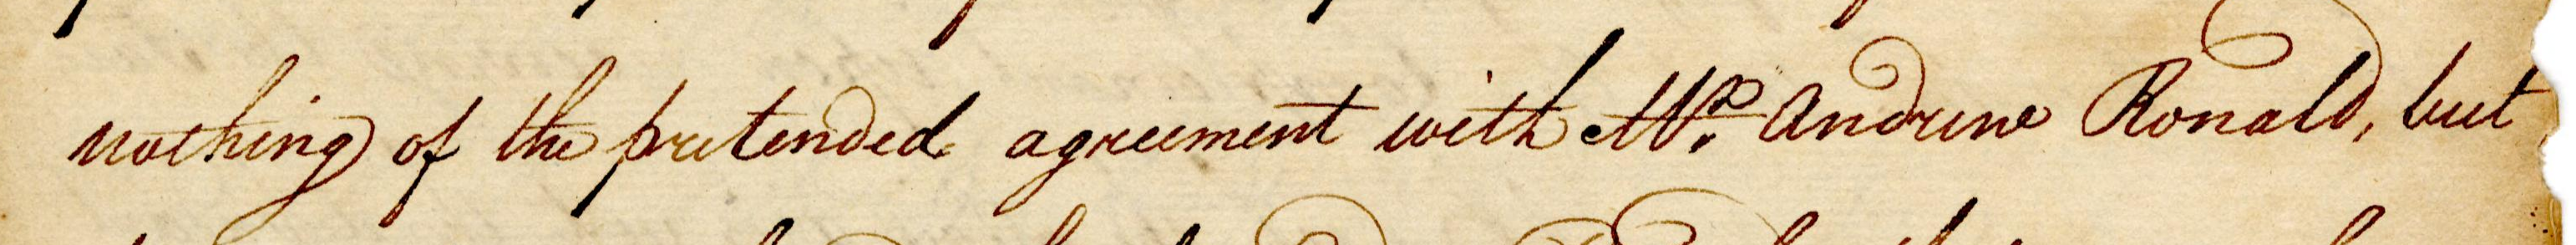nothing of the pretended agreement with M^r. Andrune Ronald, but
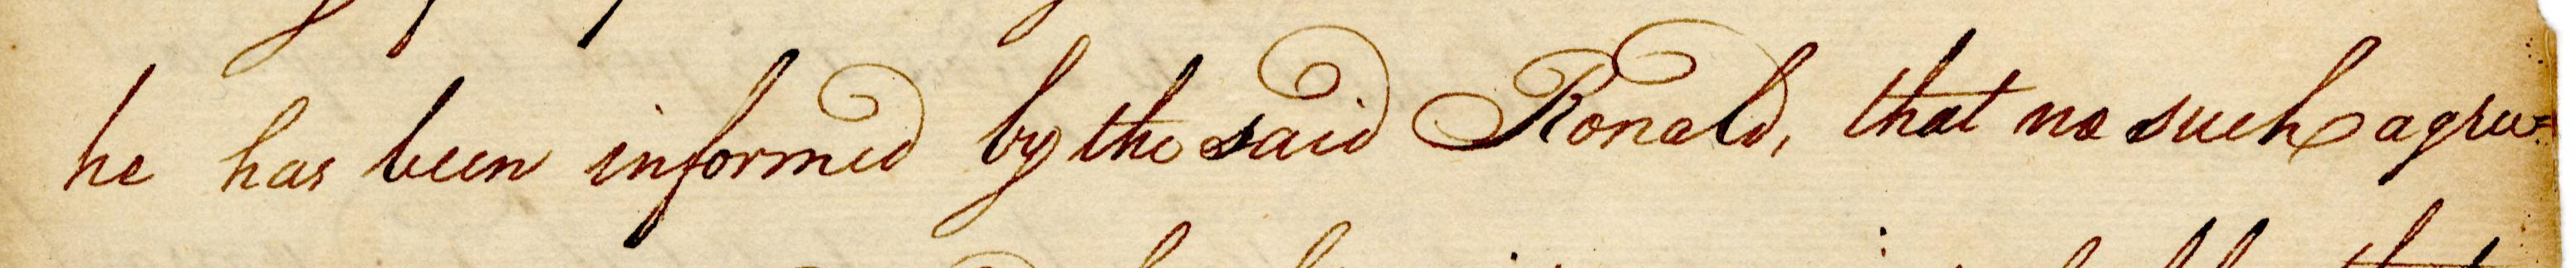he has been informed by the said Ronald, that no such agree-
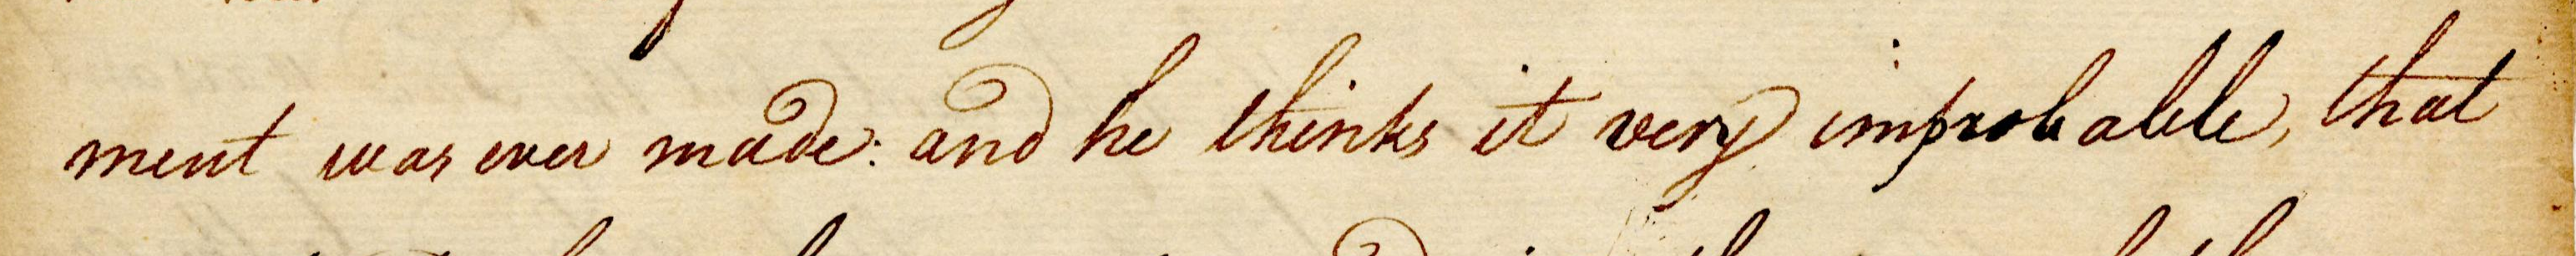-ment was ever made. and he thinks it very improbable, that
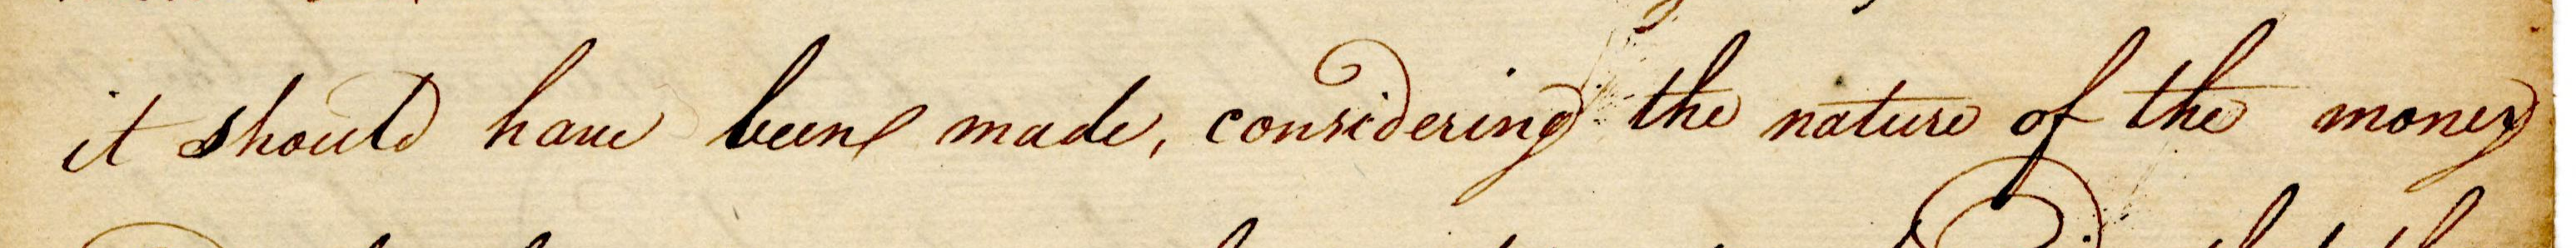it should have been made, considering the nature of the money
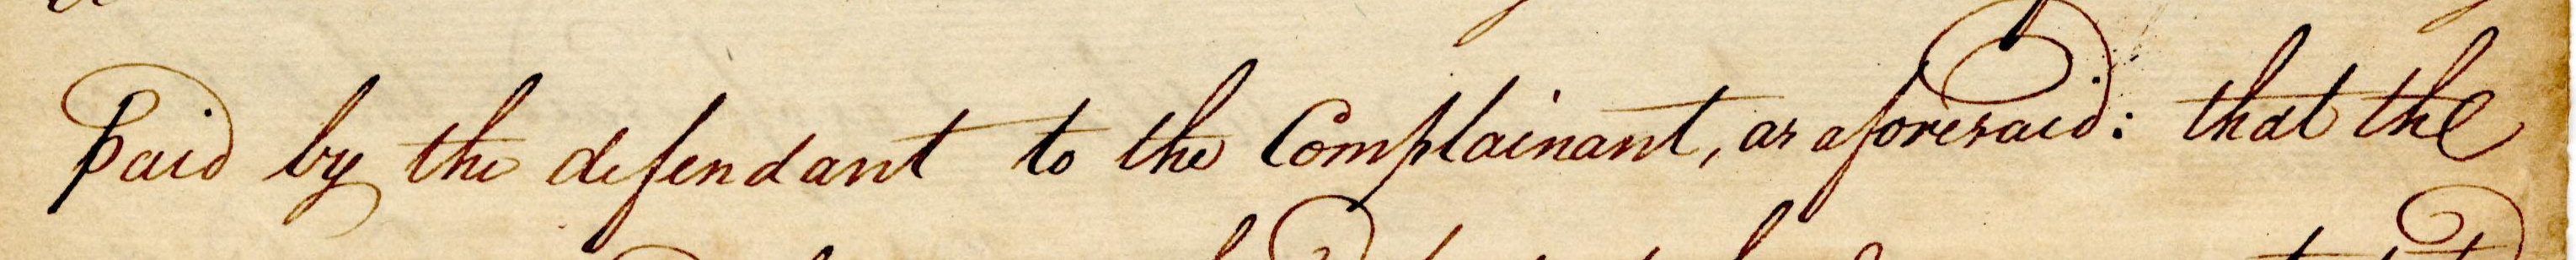paid by the defendant to the Complainant, as aforesaid: that the
